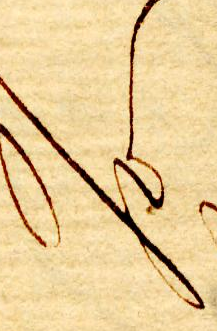To
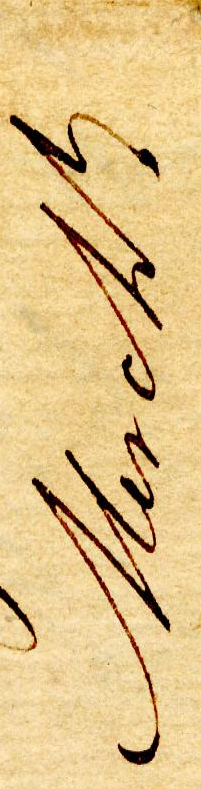Merch^t
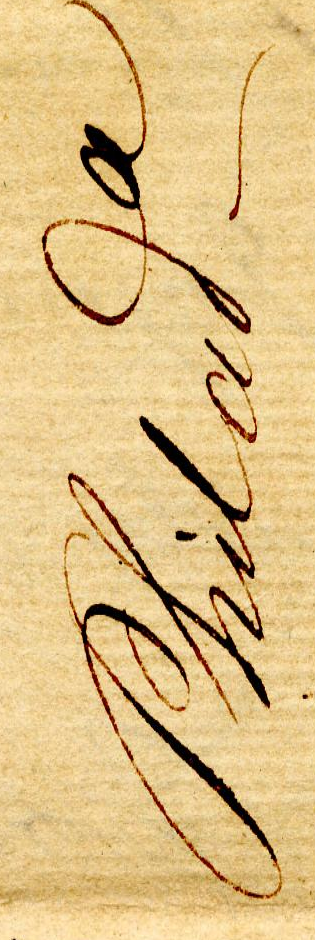Phila^a
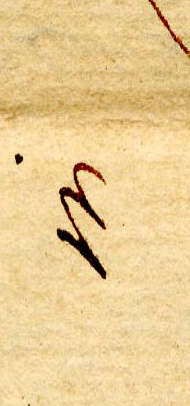in
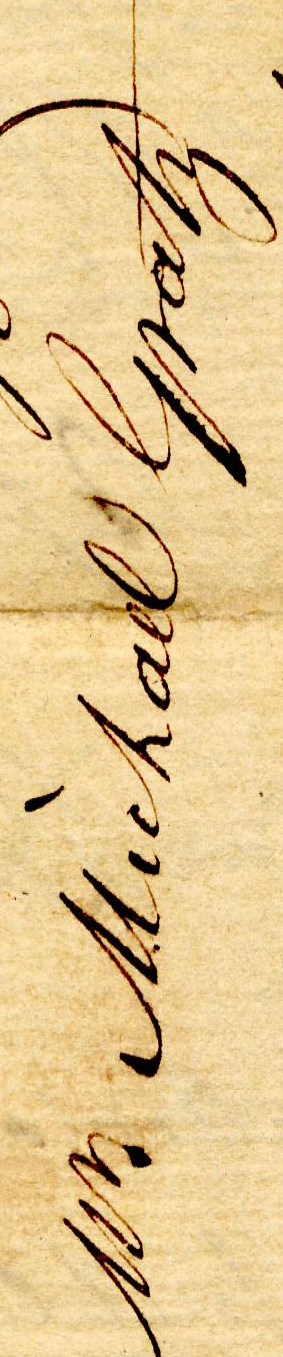M^r Michael Gratz
